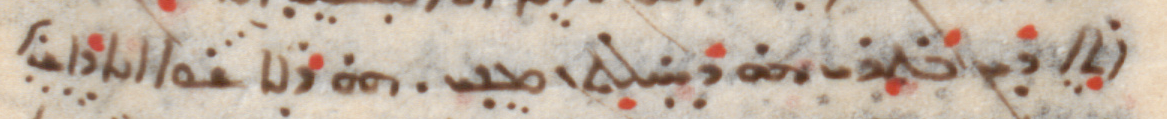ܐ̇ܬܐ ܕܝܢ ܒܬܪܝ ܗ̇ܘ ܕܚܝܠܬܢ ܡܢܝ. ܗ̇ܘ ܕܠܐ ܫ̇ܘܐ ܐܢܐ ܕܐܫܪܐ
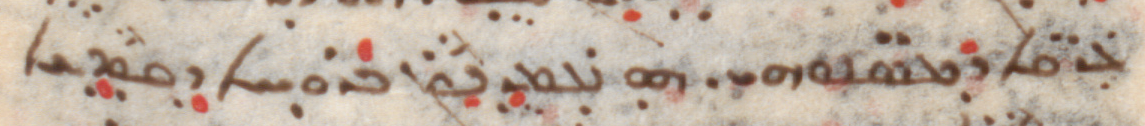ܥܪ̈ܩܐ ܕܡܣ̈ܢܘܗܝ. ܗ̣ܘ ܢܥܡܕܟܘܢ ܒܪܘܚܐ ܕܩܘܕܫܐ
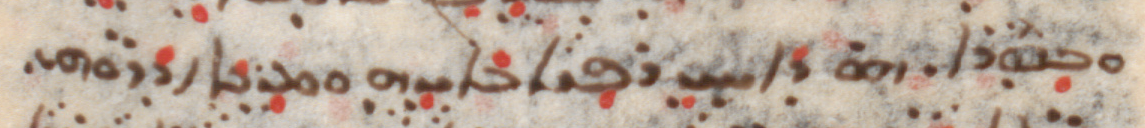ܘܒܢܘܪܐ. ܗ̇ܘ ܕܐܚܝܕ ܪܦܫܐ ܒܐܝܕܗ ܘܡܕܟܐ ܐܕܪ̈ܘܗܝ.
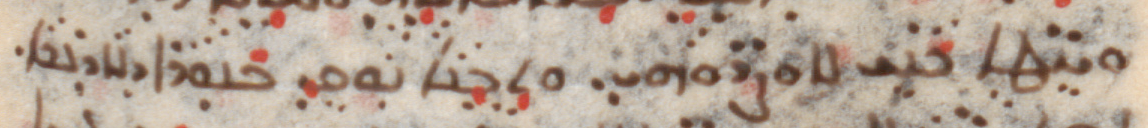ܘܚ̈ܛܐ ܟܢܫ ܠܐܘܨܪ̈ܘܗܝ܆ ܘܬܒܢܐ ܢܘܩܕ ܒܢܘܪܐ ܕܠܐ ܕܥܟܐ.
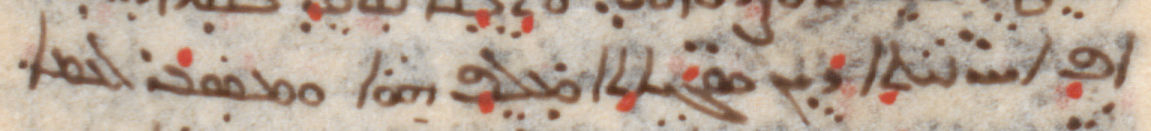ܐܦ ܐܚܪ̈ܢܝܬܐ ܕܝܢ ܣܓ̈ܝܐܬܐ ܡܠܦ ܗܘܐ ܘܡܣܒܪ ܠܥܡܐ.
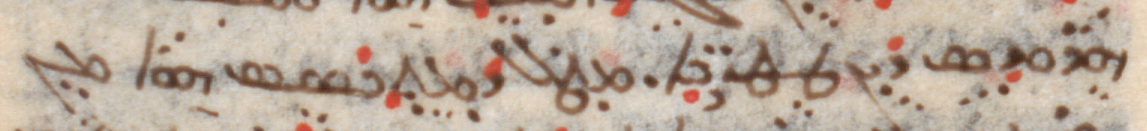ܗܪܘܕܣ ܕܝܢ ܛܛܪ̈ܟܐ. ܡܛܠ ܕܡܬܟܣܣ ܗܘܐ ܡ̣ܢ
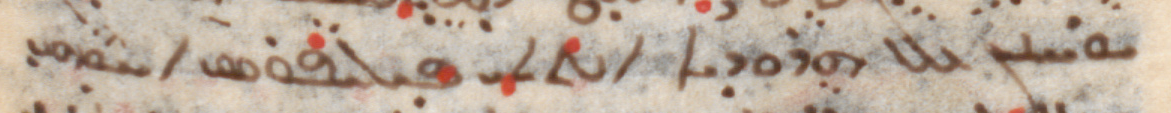ܝܘܚܢܢ ܥܠ ܗܪܘܕܝܐ ܐܢܬܬܝ ܦܝܠܝܦܘܣ ܐܚܘܗܝ.
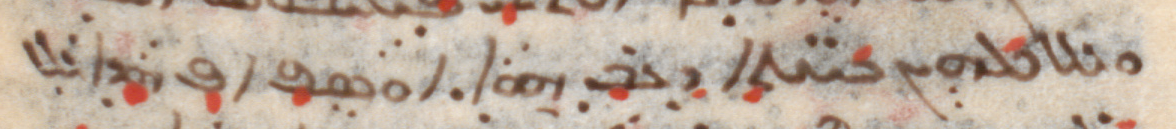ܘܥܠ ܟܠܗܝܢ ܒܝ̈ܫܬܐ ܕܥ̇ܒܕ ܗܘܐ. ܐܘܣܦ ܐܦ ܗܕܐ ܥܠ
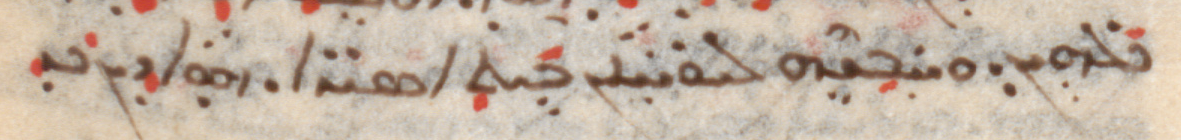ܟܠܗܝܢ܆ ܘܚܒܫܗ ܠܝܘܚܢܢ ܒܝܬ ܐܣܝܪ̈ܐ. ܗܘ̣ܐ ܕܝܢ ܟܕ
